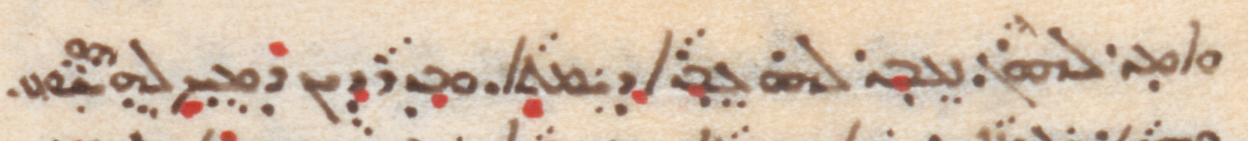ܘܐܡ̣ܪ ܠܗܘܢ. ܢܥܒ̣ܪ ܠܗ̇ܘ ܥ̣ܒܪܐ ܕܝܡܬܐ. ܘܟܕ ܪܕܝܢ ܕܡ̣ܟ ܠܗ ܗ̣ܘ ܝܫܘܥ.
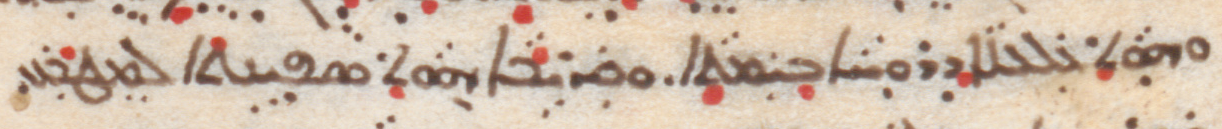ܘܗ̣ܘܬ ܥܠܥܠܐ ܕܪܘܚܐ ܒܝܡܬܐ. ܘܩܪܝܒܐ ܗܘܬ ܣܦܝܢܬܐ ܠܡܛܒܥ.
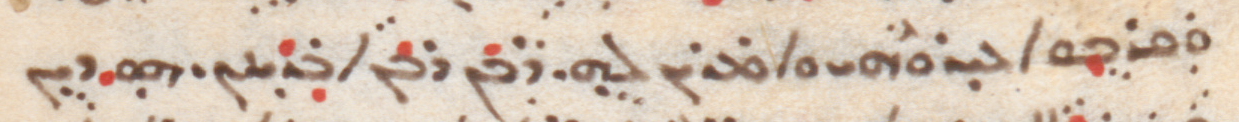ܘܩܪܒܘ ܐܥܝܪܘܗܝ ܘܐܡ̇ܪܝܢ ܠܗ. ܪܒܢ ܪܒܢ ܐܒ̇ܕܝܢܢ ܗ̣ܘ ܕܝܢ
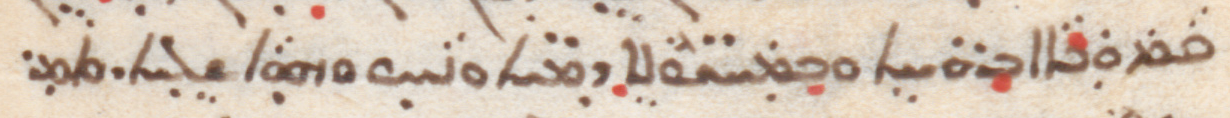ܩܡ ܘܟܐܐ ܒܪ̈ܘܚܐ ܘܒܡܚ̈ܫܘܠܐ ܕܡ̈ܝܐ ܘܢܚ̣ܘ ܘܗܘ̣ܐ ܫܠܝܐ. ܘܐܡ̣ܪ
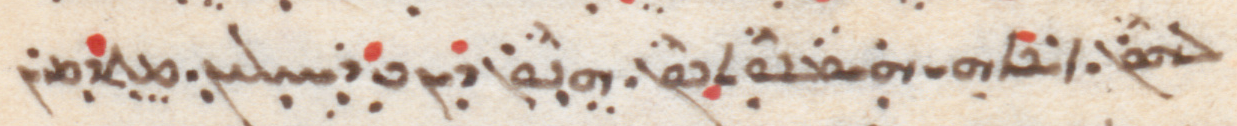ܠܗܘܢ. ܐܝܟܐ ܗܝ ܗܝܡܢܘܬܟܘܢ. ܗ̣ܢܘܢ ܕܝܢ ܟܕ ܕܚܝ̣ܠܝܢ܆ ܡܬܕܡܪܝܢ
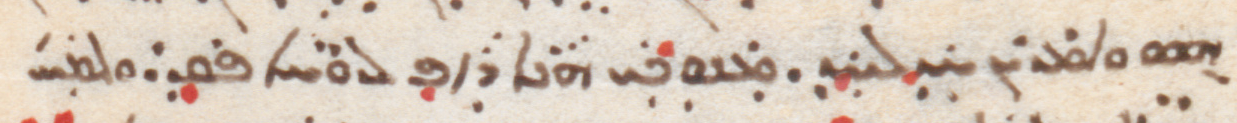ܗܘܘ ܘܐܡ̇ܪܝܢ ܚܕ ܠܚܕ. ܡܢܘ ܟܝ ܗܢܐ ܕܐܦ ܠܪ̈ܘܚܐ ܦ̇ܩܕ܇ ܘܠܡܚ
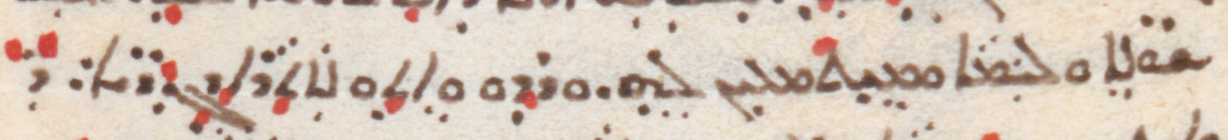ܫ̈ܘ̈ܠܐ ܘܠܝܡܐ ܘܡܫ̣ܬܡܥܝܢ ܠܗ. ܘܪܕܘ ܘܐܬ̣ܘ ܠܐܬܪܐ ܕܓܕܪ̈ܝܐ܇ ܏ܕ
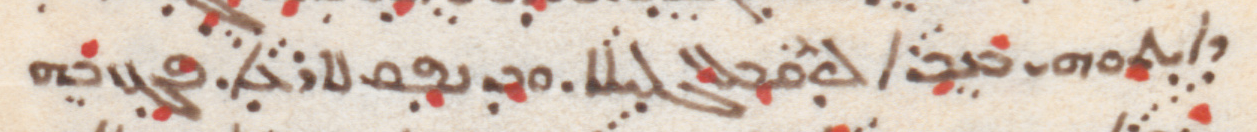ܕܐܝ̣ܬܘܗܝ ܒܥܒܪܐ ܠܘܩܒܠ ܓܠܝܠܐ. ܘܟܕ ܢܦ̣ܩ ܠܐܪܥܐ܆ ܦܓ̣ܥ ܒܗ
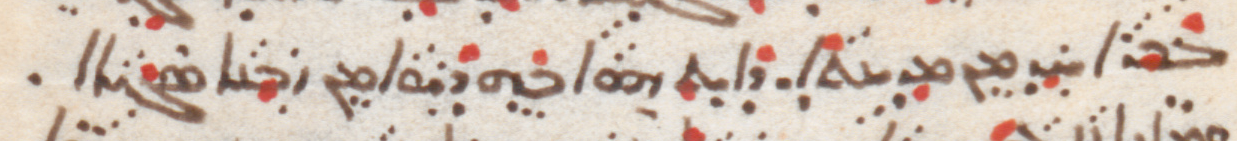ܓܒܪܐ ܚܕ ܡ̣ܢ ܡܕܝܢܬܐ܆ ܕܐܝ̣ܬ ܗܘܐ ܒܗ ܕܝܘܐ ܡ̣ܢ ܙܒܢܐ ܣܓܝܐܐ.
